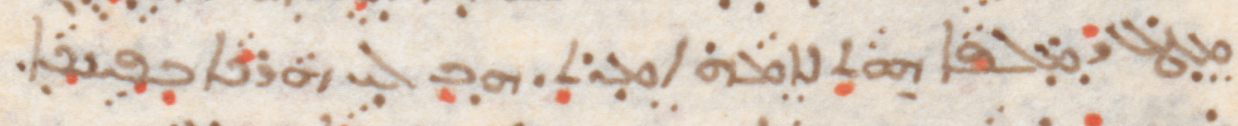ܡܛܠ ܕܡܠܦܐ ܗܘܬ ܠܐܡܗ̇ ܐܡ̣ܪܬ. ܗ̣ܒ ܠܝ ܗܪܟܐ ܒܦܝܢܟܐ.
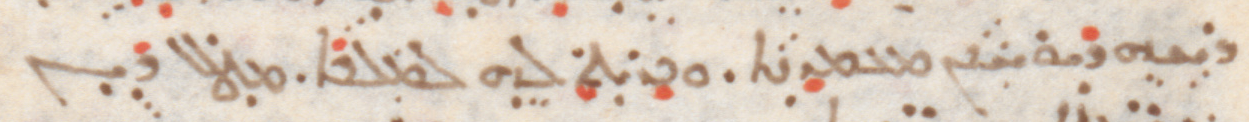ܪܝܫܗ ܕܝܘܚܢܢ ܡܥܡܕܢܬ. ܘܟܪܝܬ݀ ܠܗ ܠܡܠܟܐ. ܡܛܠ ܕܝܢ
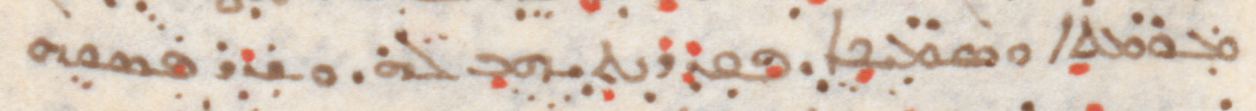ܡܘ̈ܡܬܐ ܘܣܡ̈ܝܟܐ܆ ܦܩ̣ܕ ܕܢܬܝܗܒ ܠܗ̇. ܘܫܕܪ ܦܣܩܗ
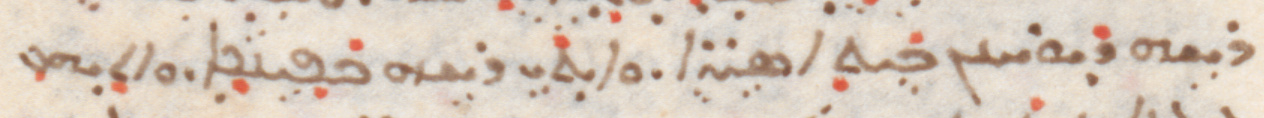ܪܝܫܗ ܕܝܘܚܢܢ ܒܝܬ ܐܣܝܪ̈ܐ. ܘܐܝ̣ܬܝ ܪܝܫܗ ܒܦܝܢܟܐ. ܘܐܬܝܗܒ
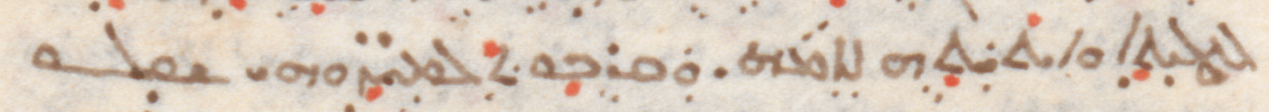ܠܛܠܝܬܐ ܘܐܝܬܝܬܗ ܠܐܡܗ. ܘܩܪܒܘ ܬܠܡܝ̈ܕܘܗܝ ܫܩ̣ܠܘ
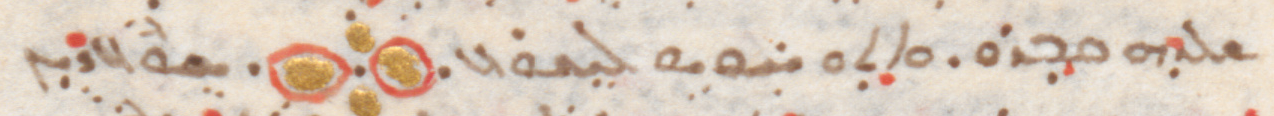ܫܠܕܗ ܩܒܪܘ. ܘܐܬ̣ܘ ܚܘܝܘ ܠܝܫܘܥ܀ ܝܫܘܥ ܕܝܢ
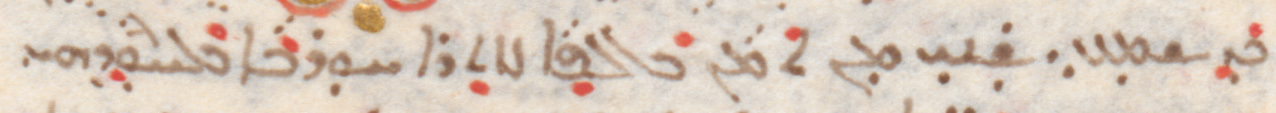ܟܕ ܫܡ̣ܥ: ܫܢܝ ܡ̣ܢ ܬܡܢ ܒܐܠܦܐ ܠܐܬܪܐ ܚܘܪܒܐ ܒܠܚܘܕܗܝ.
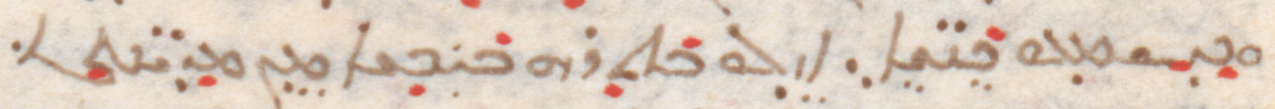ܘܟܕ ܫܡܥ̣ܘ ܟܢ̈ܫܐ܆ ܐܙ̣ܠܘ ܒܬܪܗ ܒܝܒܫܐ ܡ̣ܢ ܡܕܝ̈ܢܬܐ
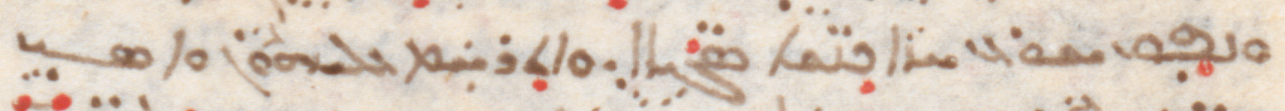ܘܢܦ̣ܩ ܝܫܘܥ ܚܙܐ ܟܢ̈ܫܐ ܣܓ̈ܝܐܐ܆ ܘܐܬܪܚܡ ܥܠܝܗܘܢ ܘܐܣܝ
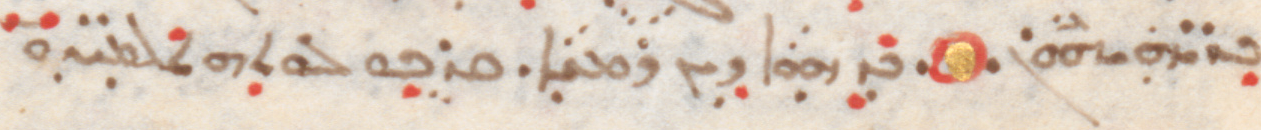ܟܪ̈ܝܗܝܗܘܢ . ܟܕ ܗܘ̣ܐ ܕܝܢ ܪܡܫܐ. ܩܪܒܘ ܠܘܬܗ ܬܠܡܝ̈ܕ܏ܘ
